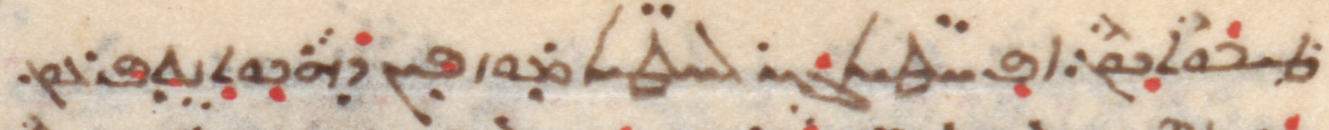ܛܝܒܘܬܟܘܢ܇ ܐܦ ܚܛ̈ܝܐ ܓܝܪ ܠܚܛ̈ܝܐ ܡ̇ܘܙܦ̣ܝܢ ܕܗܟܘܬ ܢ̣ܬܦܪܥܘܢ.
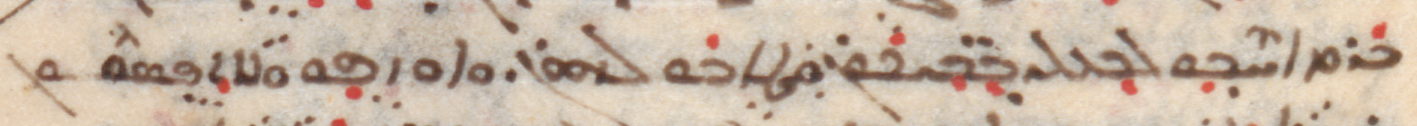ܒܪܡ ܐܚܒ̣ܘ ܠܒܥܠܕܒ̈ܒܝܟܘܢ ܘܛܐܒܘ ܠܗܘܢ. ܘܐܘܙܦܘ ܘܠܐ ܬܦܣܩܘܢ
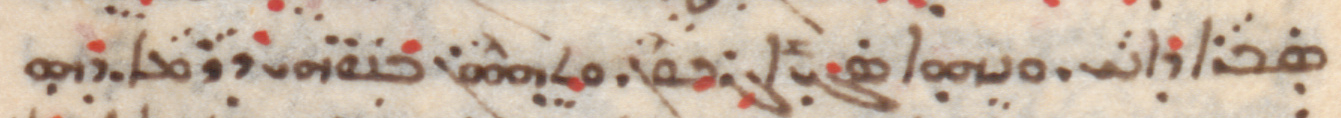ܣܒܪܐ ܕܐܢܫ. ܘܢܗܘܐ ܣ̇ܓܝ ܐܓܪܟܘܢ. ܘܬܗܘܘܢ ܒܢܘ̈ܗܝ ܕܪܡܐ. ܕܗ̣ܘ
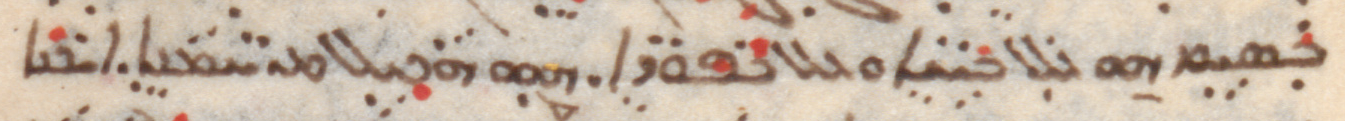ܒܲܣܝܡ ܗܘ ܥܠ ܒܝ̈ܫܐ ܘܥܠ ܟܦܘܪ̈ܐ. ܗ̣ܘܘ ܗܟܝܠ ܡܪ̈ܚܡܢܐ܆ ܐܝܟܢܐ
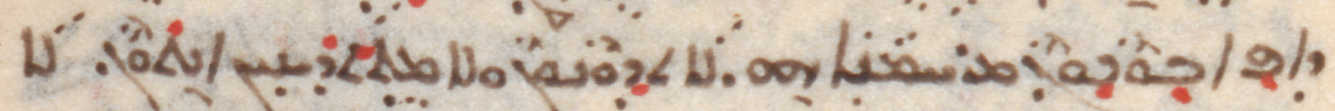ܕܐܦ ܐܒܘܟܘܢ ܡܪܚܡܢܐ ܗܘ. ܠܐ ܬܕܘܢܘܢ ܘܠܐ ܡܬܬܕܝܢ̣ܝܢ ܐܢܬܘܢ. ܠܐ
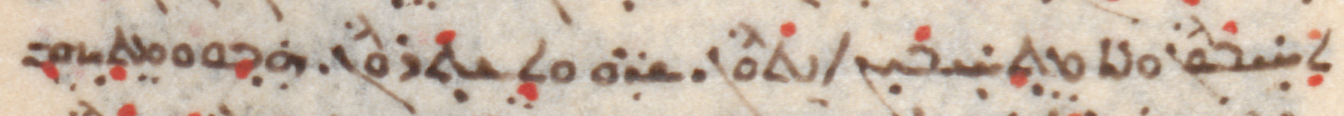ܬܚܝܒܘܢ ܘܠܐ ܡܬܚܝܒܝܢ ܐܢܬܘܢ. ܫܪܘ ܘܬܫܬܪܘܢ. ܗܒܘ ܘܡܬܝܗܒ
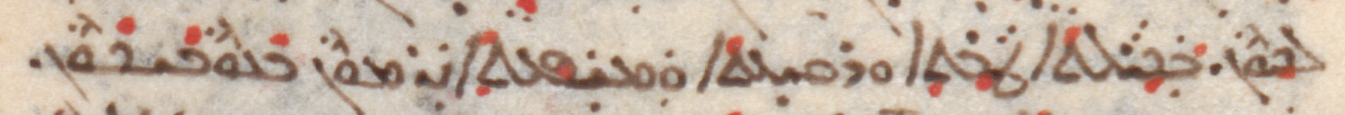ܠܟܘܢ. ܒܟܝܠܬܐ ܛܒܬܐ ܘܪܩܝܥܬܐ ܘܡܫܦܥܬܐ ܢܪܡܘܢ ܒܥܘܒ̈ܝܟܘܢ.
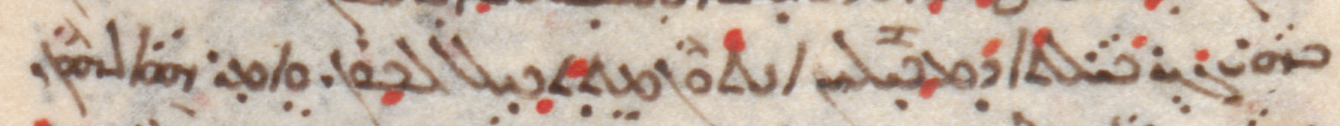ܒܗ̇ܝ ܓܝܪ ܟܝܠܬܐ ܕܡܟܝܠܝܢ ܐܢܬܘܢ ܡܬܬܟܝܠ ܠܟܘܢ. ܘܐܡ̣ܪ ܗܘܐ ܠܗܘܢ
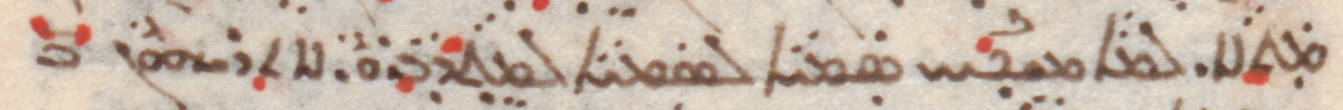ܡܬܠܐ. ܠܡܐ ܡܫܟ̣ܚ ܣܡܝܐ ܠܣܡܝܐ ܠܡܬܕܒܪܘ. ܠܐ ܬܪܝܗܘܢ ܏ܒ
